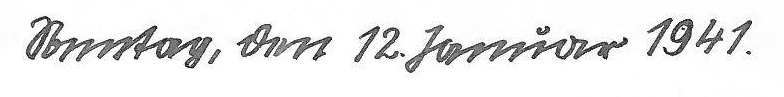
Sonntag, den 12. Januar 1941
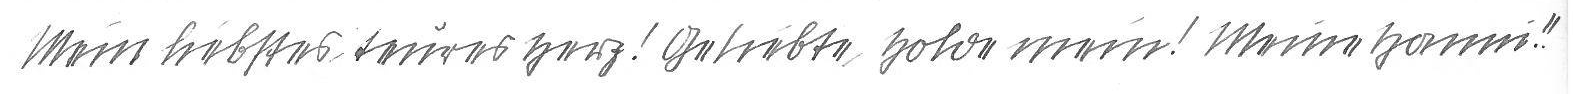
Mein liebstes teures Herz! Geliebte Holde mein! Meine Hilde!
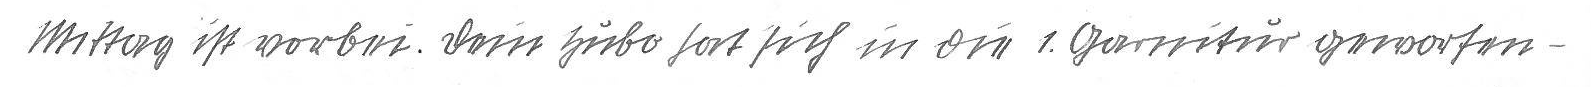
Mittag ist vorbei. Dein Hubo hat sich in die 1. Garnitur geworfen –
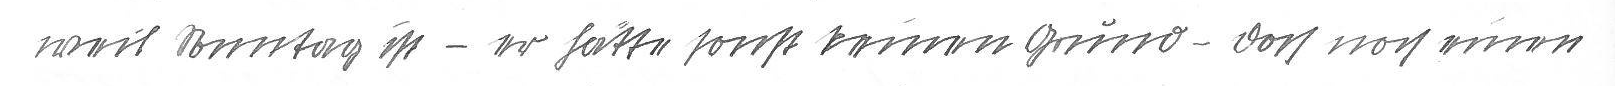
weil Sonntag ist – er hatte sonst keinen Grund – doch noch einen
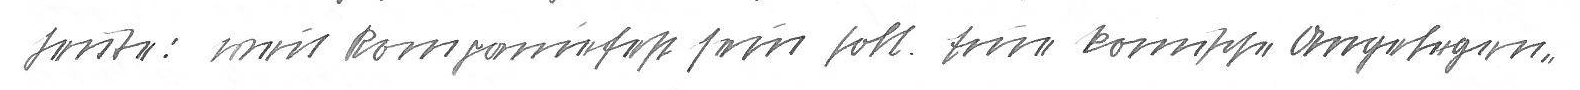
heute: weil Kompaniefest sein soll. Eine komische Angelegenheit:
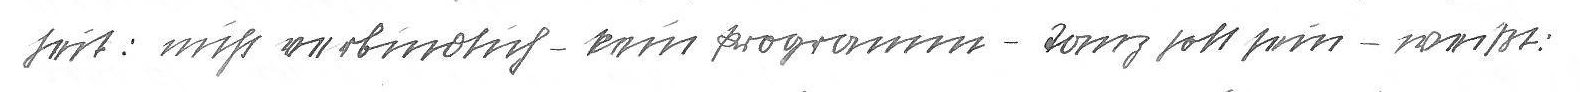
nicht verbindlich – kein Programm – Tanz soll sein – weiß:
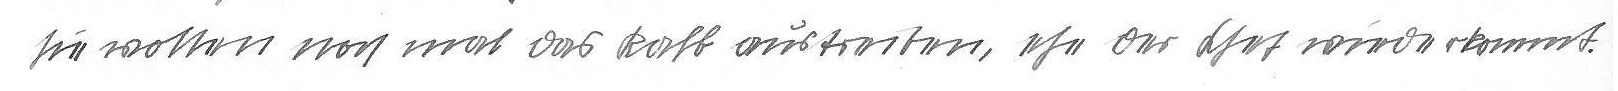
sie wollen noch mal das Kalb austreiben, ehe der Chef wiederkommt.
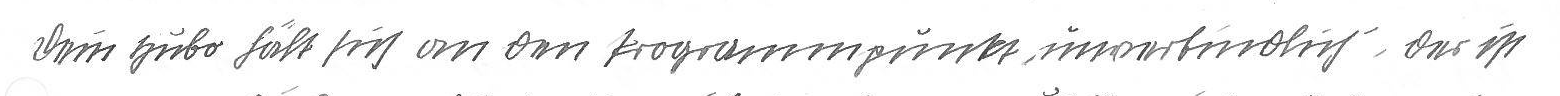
Dein Hubo hält sich an den Programmpunkt, ‘unverbindlich’, der ist
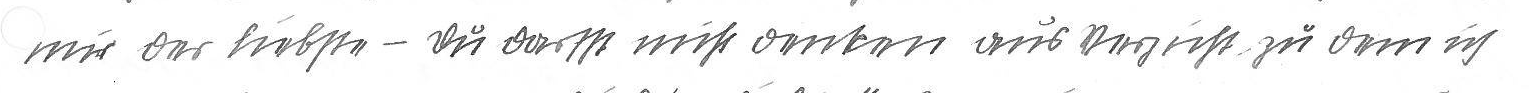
mir der liebste – Du darfst nicht denken aus Verzicht, zu dem ich
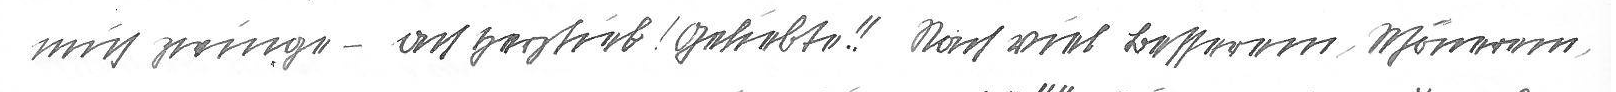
mich zwinge – ach Herzlieb! Geliebte!! Nach viel Besserem, Schönerem,
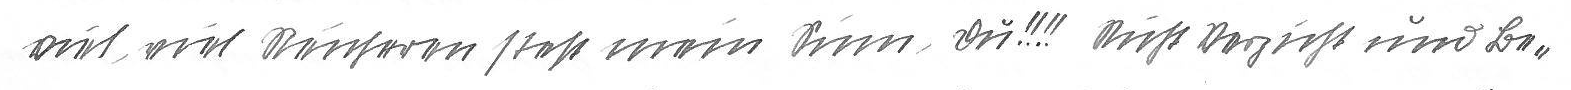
viel, viel Reicherem steht mein Sinn, Du!!!! Nicht Verzicht und Be¬
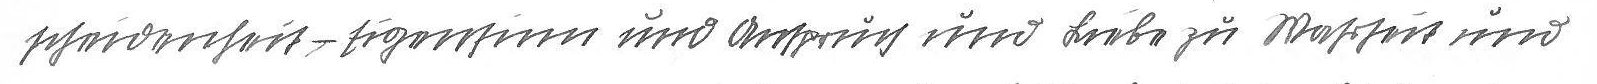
scheidenheit – Eigensinn und Anspruch und Liebe zu Wahrheit und
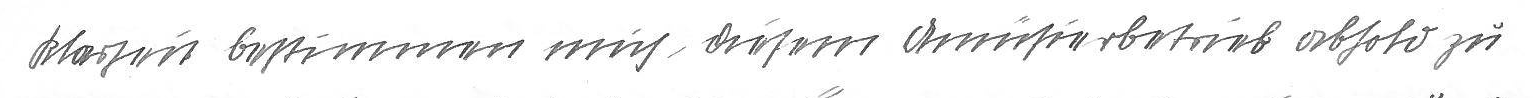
Klarheit bestimmen mich, diesem Amüsierbetrieb abhold zu
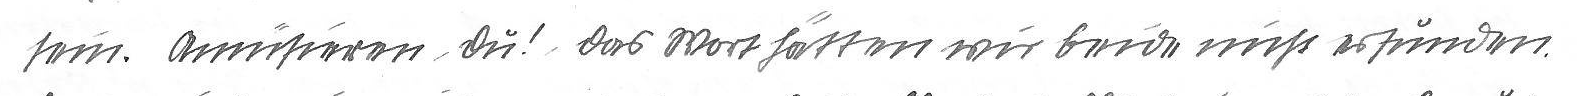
sein. Amüsieren, Du! Das Wort hätten wir beide nicht erfunden.
